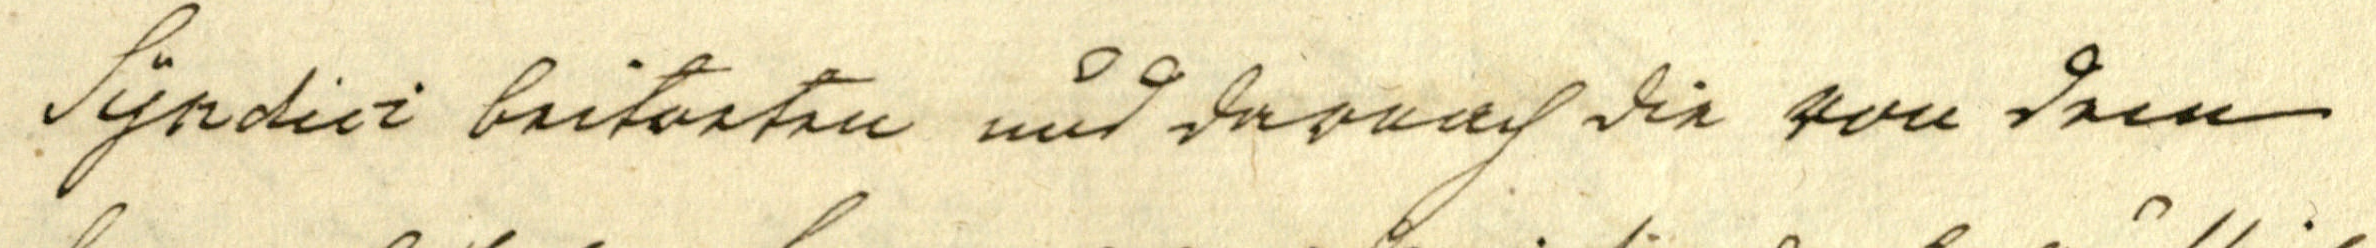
Sÿndici beitreten und darnach die von dem
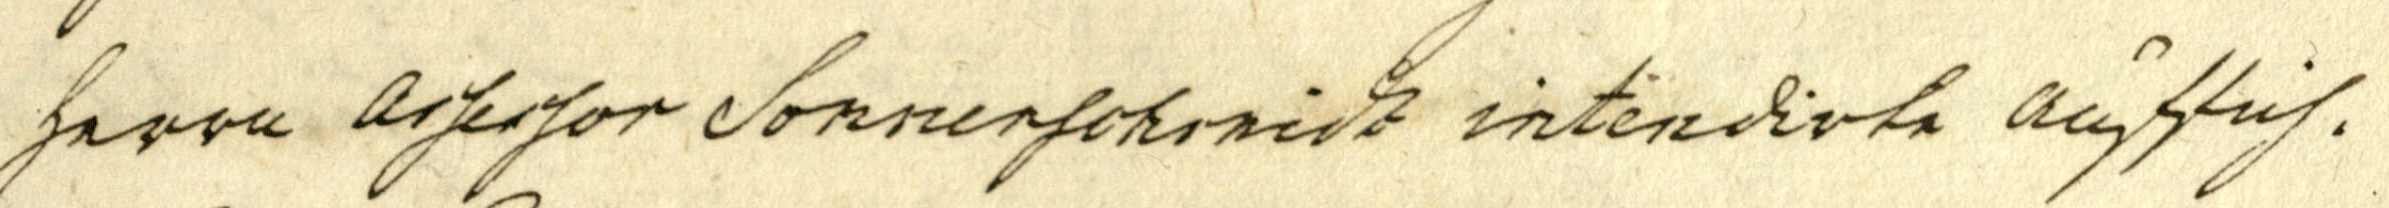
herrn Assessor Sonnenschmidt intendirte Auffüh¬
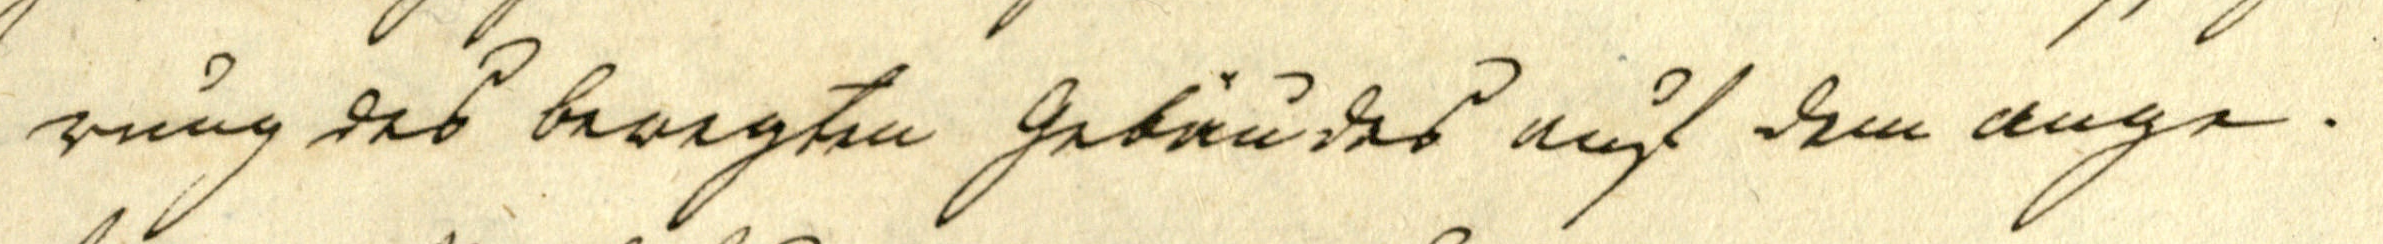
rung des bewegten Gebäudes auf dem ange¬
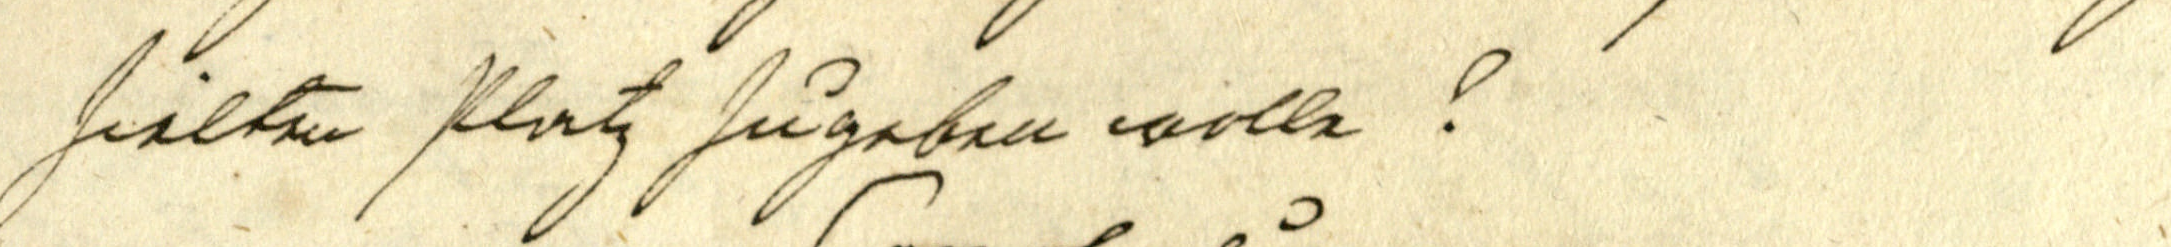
zielten Platz zugeben wolle!
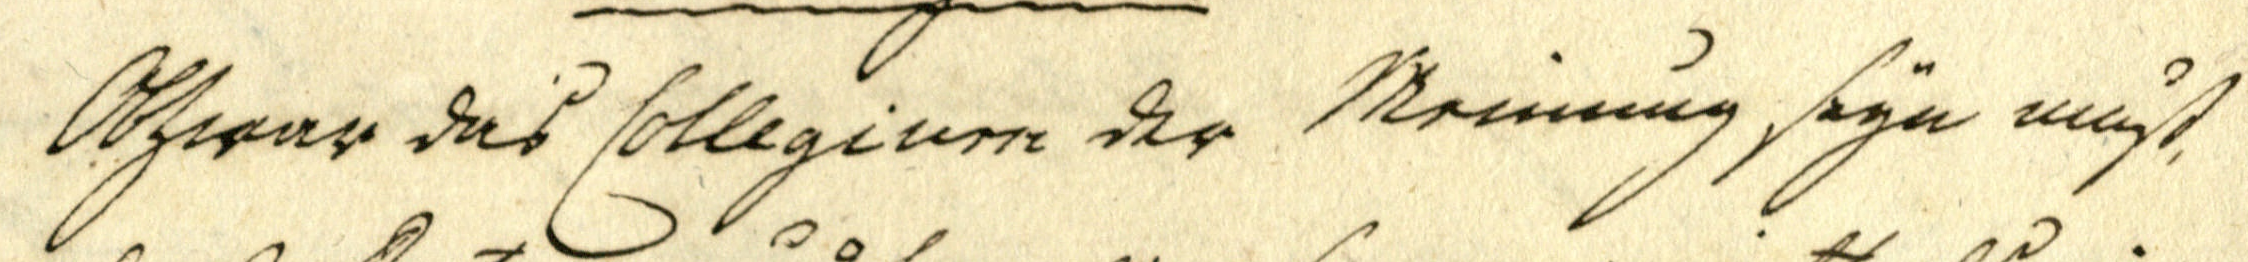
Obzwar das Collegium der Meinung seÿn muß,
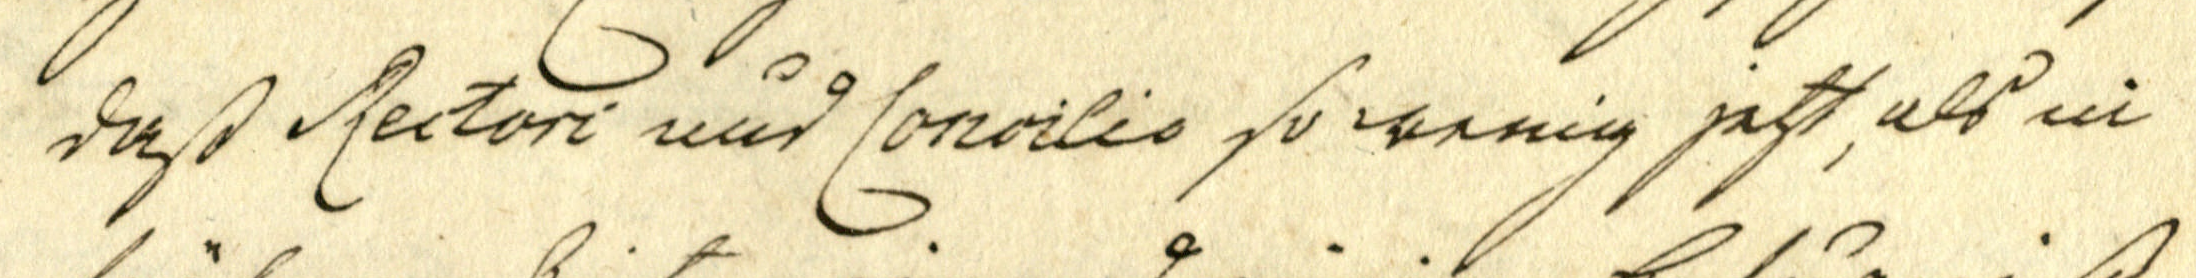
daß Rectori und Concilio so wenig jetzt, als in
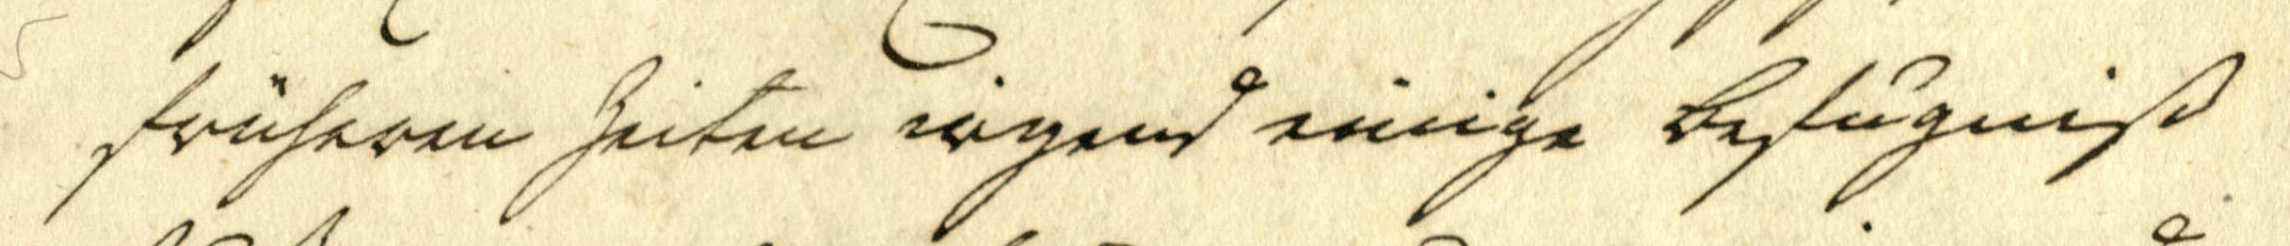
früheren Zeiten irgend einige Befugniß
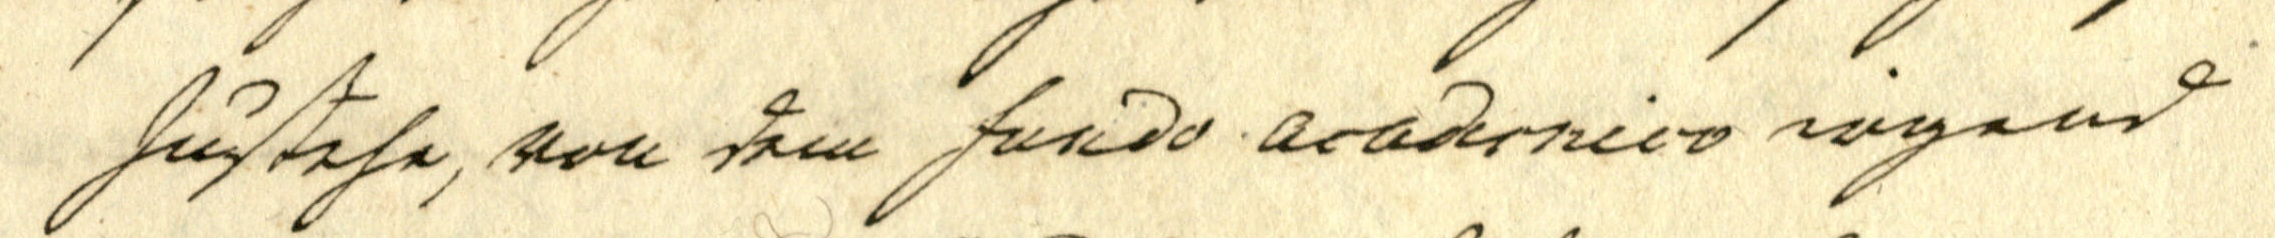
zustehe, von dem fundo academico irgend
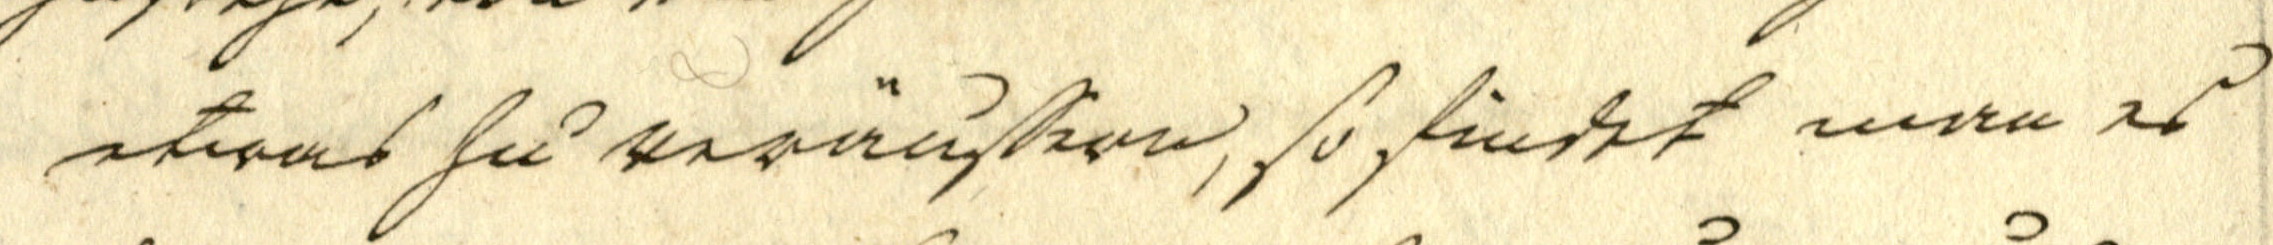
etwas zu veräussern, so findet man es
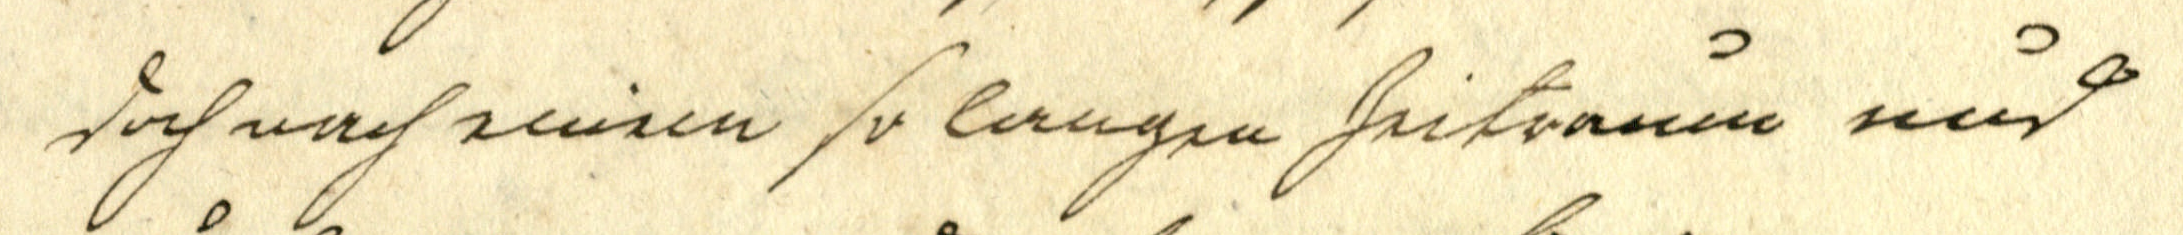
doch nach einem so langen Zeitraum und
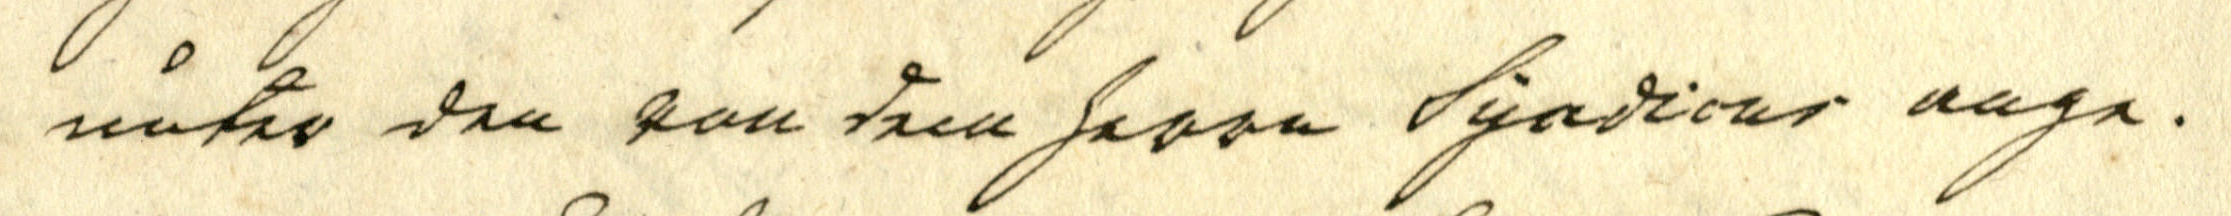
unter den von dem herrn Sÿndicus ange¬
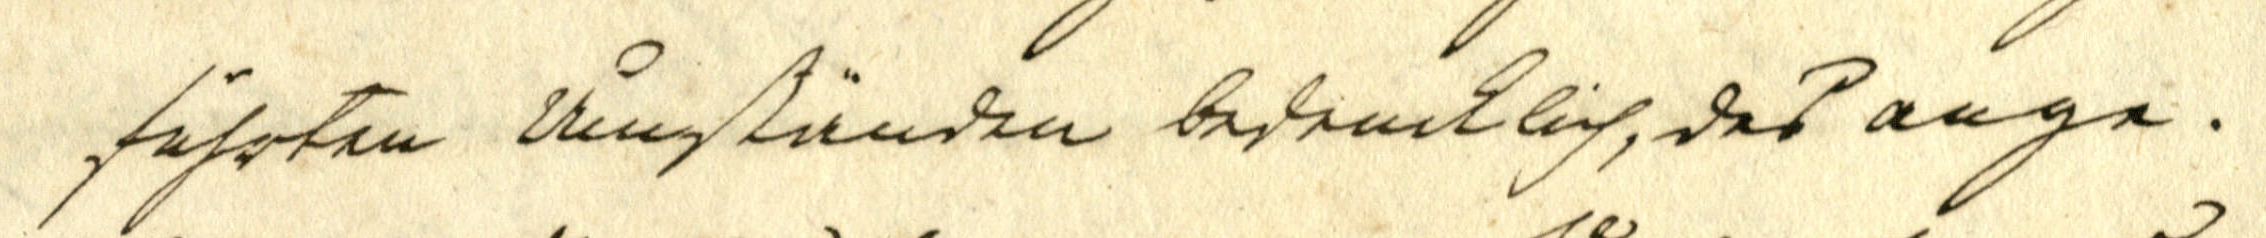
führten Umständen bedencklich, des ange¬
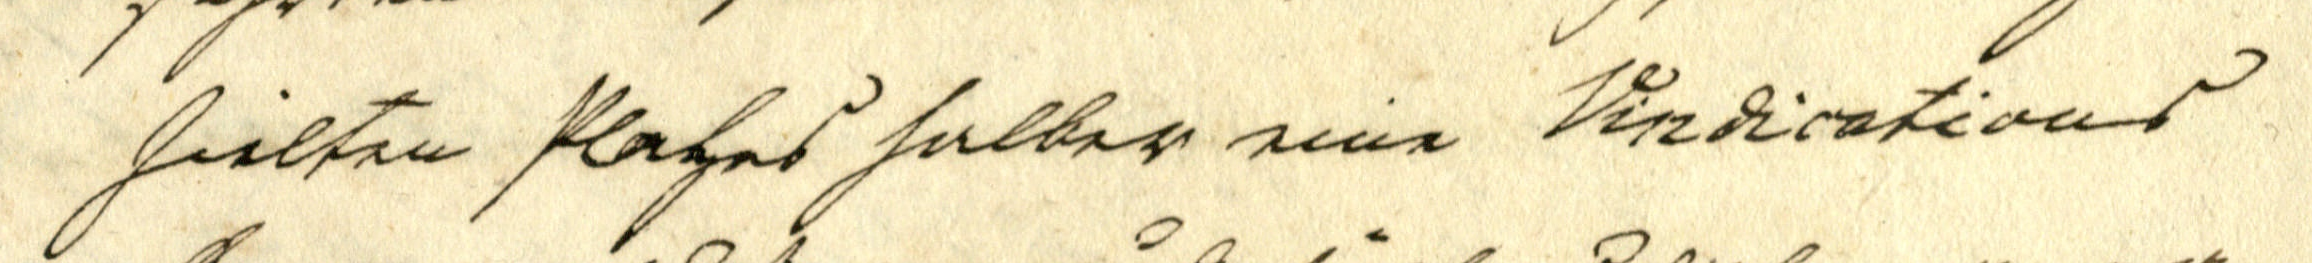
zielten Platzes halber eine Vindications¬
